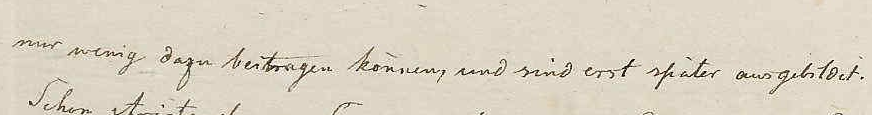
nur wenig dazu beitragen können, und sind erst später ausgebildet.
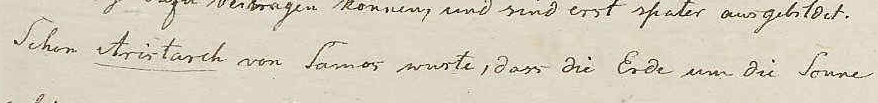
Schon Aristarch von Samos wuste, dass die Erde um die Sonne
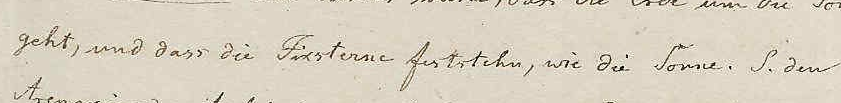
geht, und dass die Fixsterne feststehn, wie die Sonne. S. den
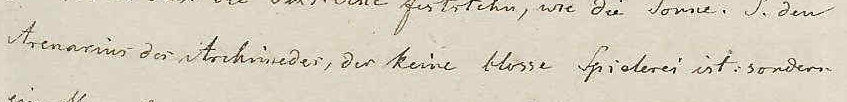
Arenarius des Archimedes, der keine blosse Spielerei ist sondern
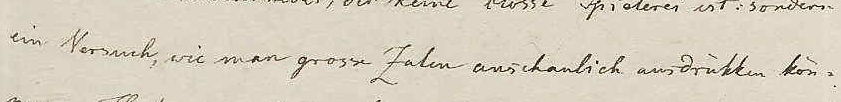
ein Versuch, wie man grosse Zalen anschaulich ausdrükken kön-
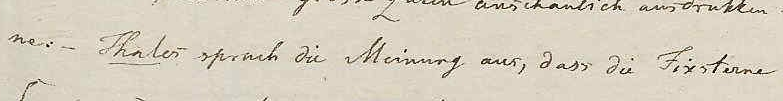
ne: – Thales sprach die Meinung aus, dass die Fixsterne
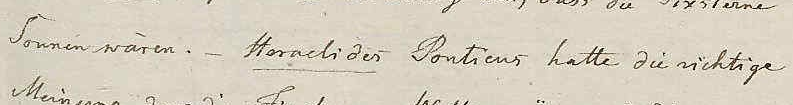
Sonnen wären. – Heraclides Ponticus hatte die richtige
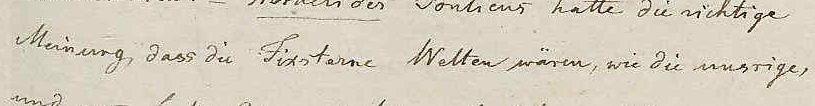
Meinung, dass die Fixsterne Welten wären, wie die unsrige,
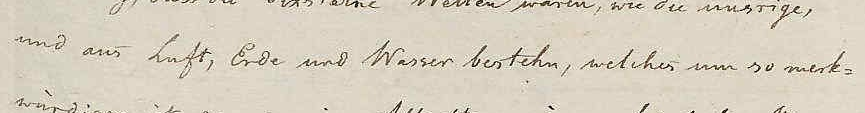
und aus Luft, Erde und Wasser bestehn, welches um so merk-
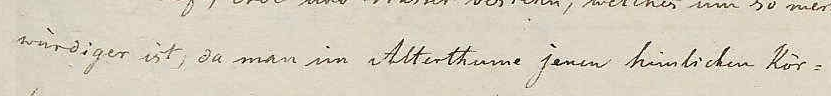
würdiger ist, da man im Alterthume jenen Kör-
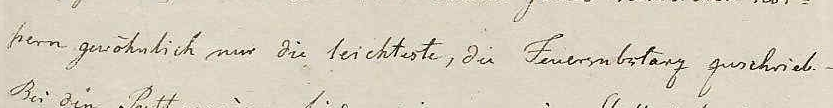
pern gewöhnlich nur die leichteste, die Feuersubstanz zuschrieb. –
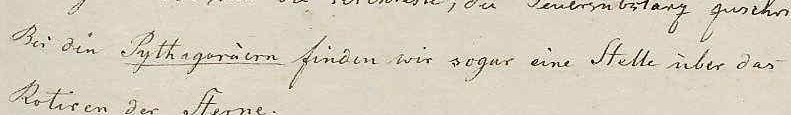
Bei den Pythagoräern finden wir sogar eine Stelle über das
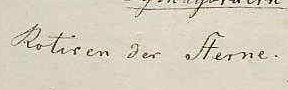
Rotiren der Sterne.
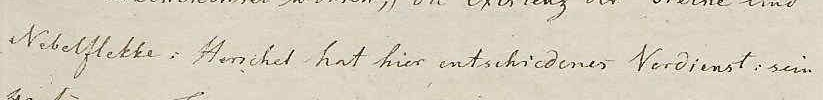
Nebelflekke: Herschel hat hier entschiedenes Verdienst: sein
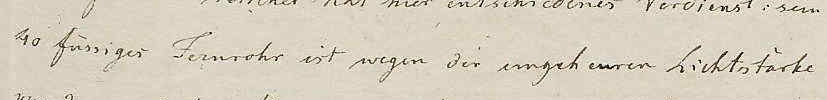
40 füssiges Fernrohr ist wegen der ungeheuren Lichtstärke
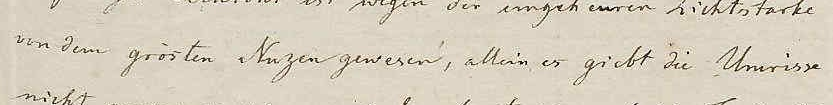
von dem grösten Nuzen gewesen, allein es giebt die Umrisse
